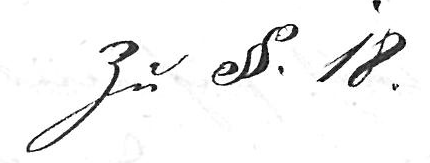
Zu §. 18.
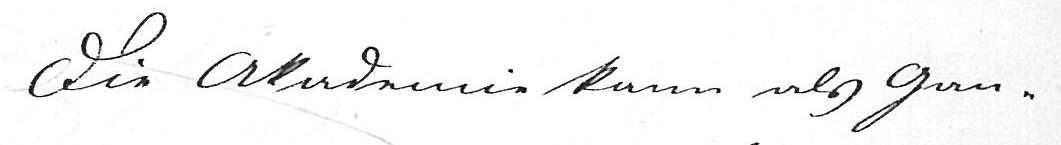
Die Akademie kann als Gan-
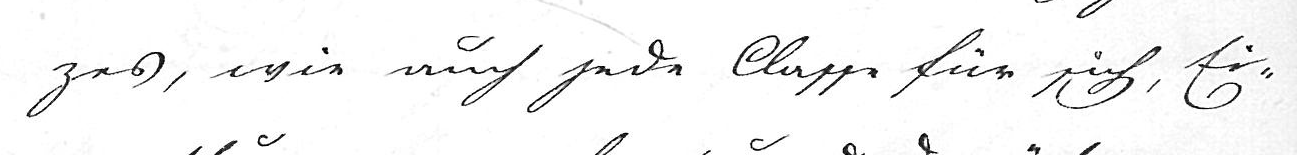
zes, wie auch jede Classe für sich, Ei-
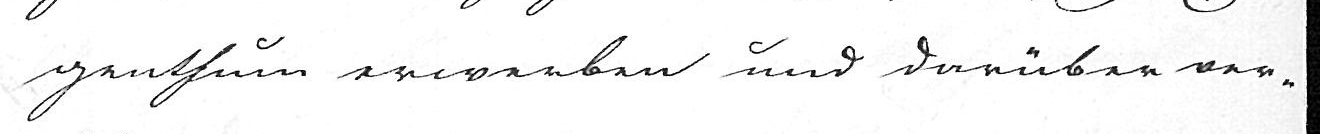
genthum erwerben und darüber ver-
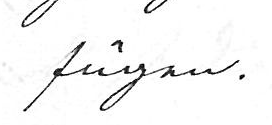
fügen.
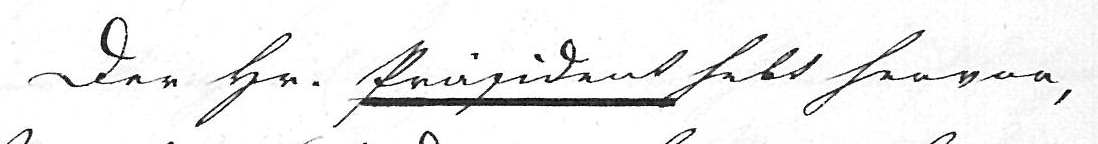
Der Hr. Präsident hebt hervor,
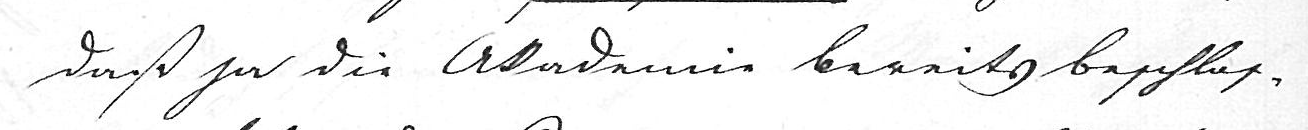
daß ja die Akademie bereits beschlos-
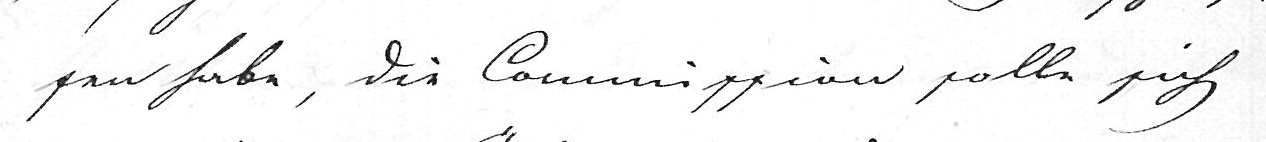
sen habe, die Commission solle sich
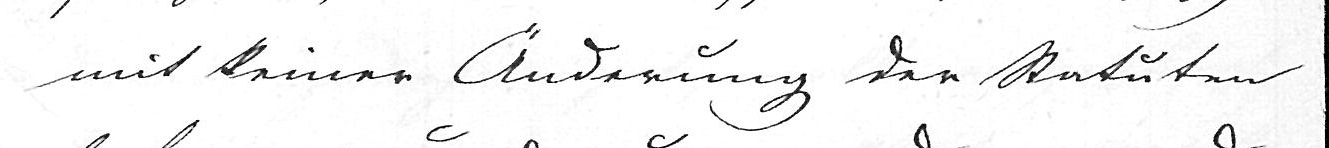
mit keiner Änderung der Statuten
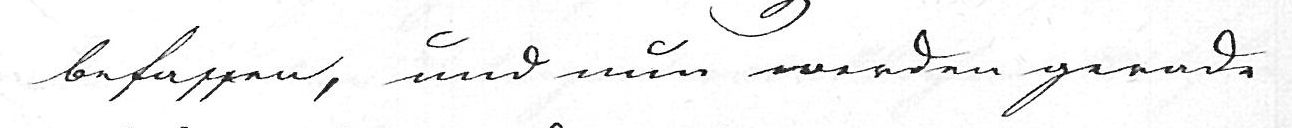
befassen, und nun werden gerade
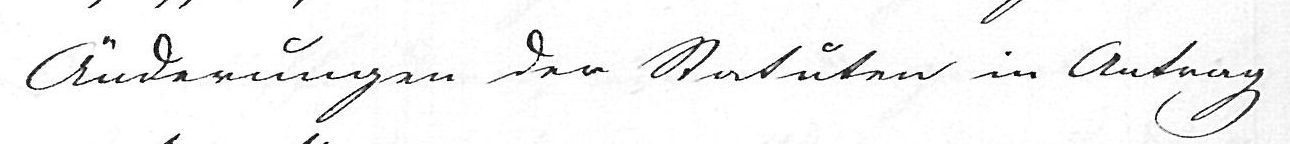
Änderungen der Statuten in Antrag
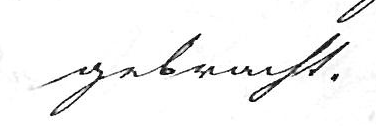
gebracht.
